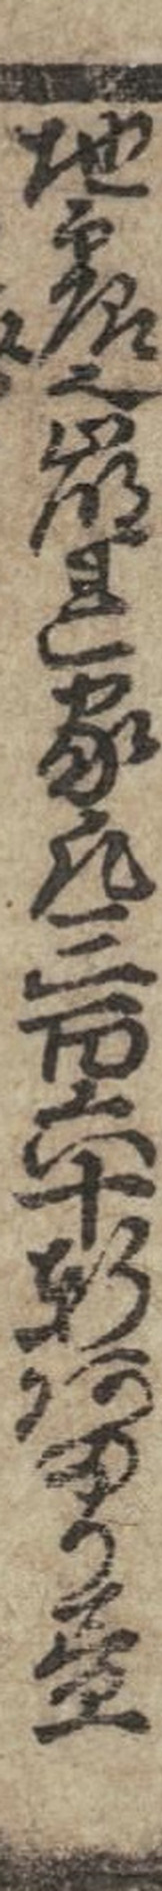地震崩れ家凡三百六十軒あまり昼
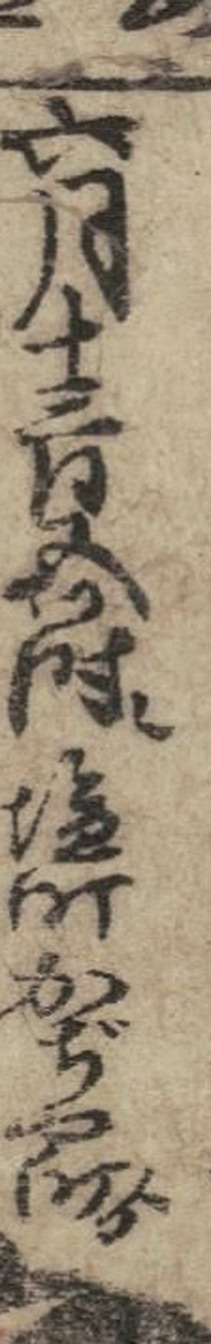六月十三日五ツ時ゟ塩町かじや町ゟ
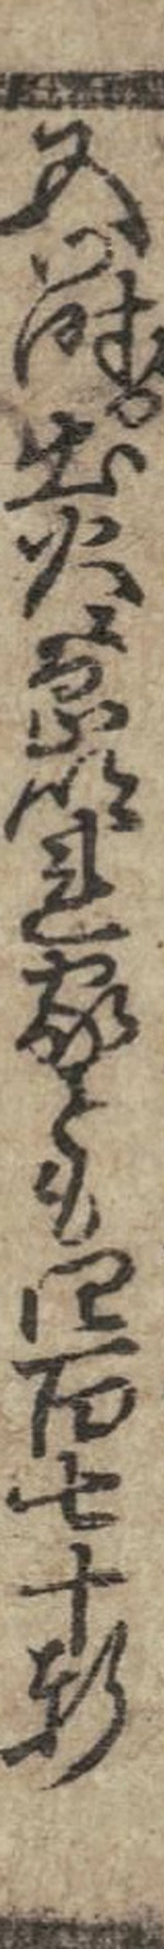五ツ時ゟ出火にて崩れ家とも四百七十軒
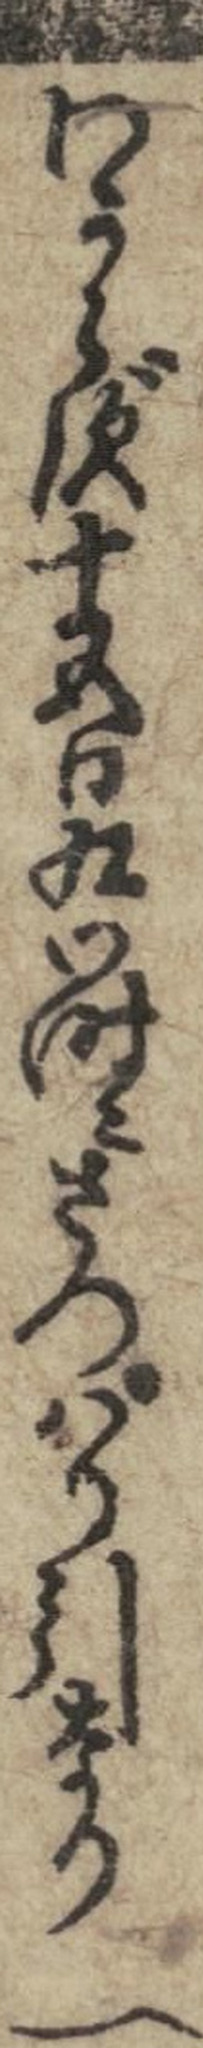わからず十五日九ツ時にさつぱり引なり
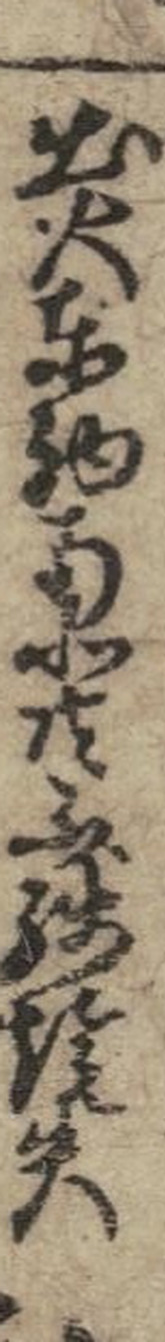出火東西南北とも不残焼失
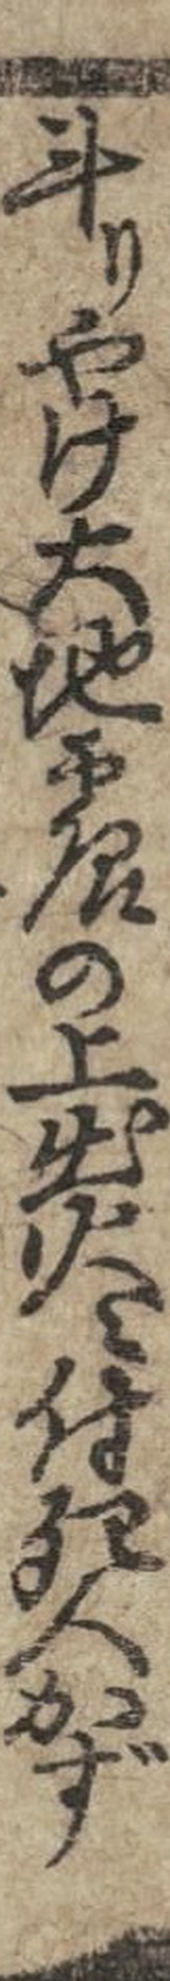計りやけ大地震の上出火に付死人かず
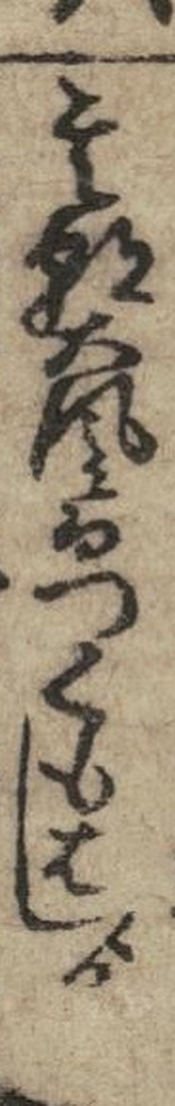其朝大風に而つくもはしゟ
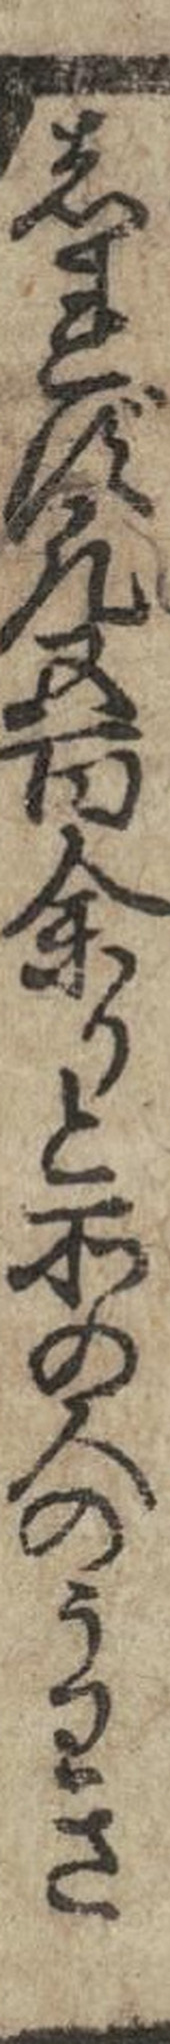しれず凡五百余りと所の人のうわさ
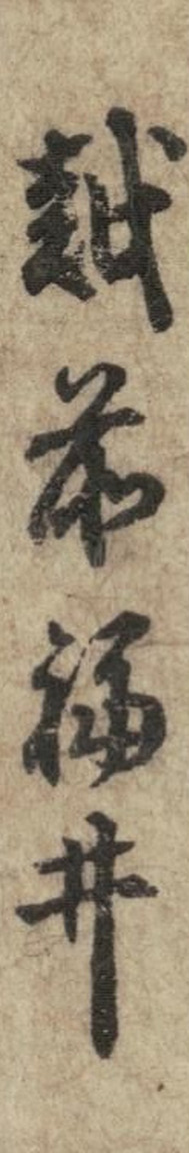越前福井
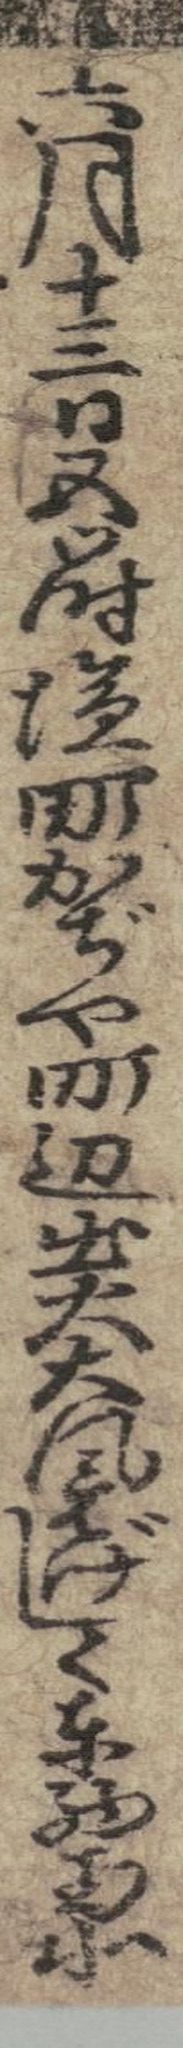六月十三日五ツ時塩町かぢや町辺出火大風はげしく東西南北
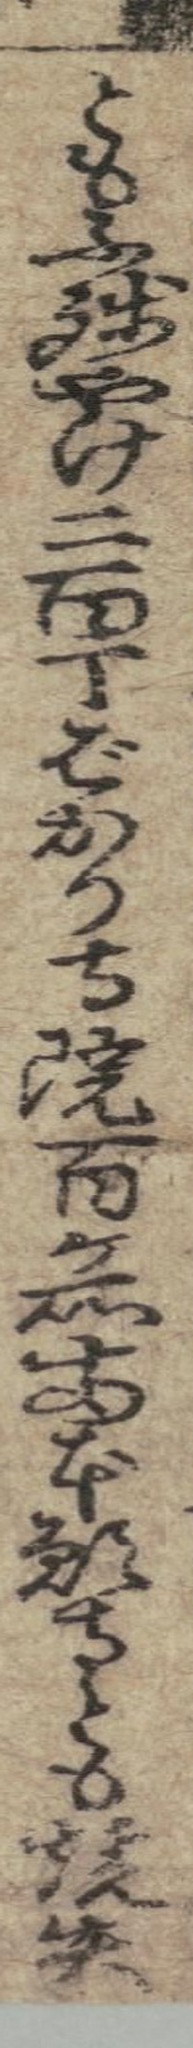とも不残やけ二百丁ばかり寺院百ケ所両本願寺とも焼失
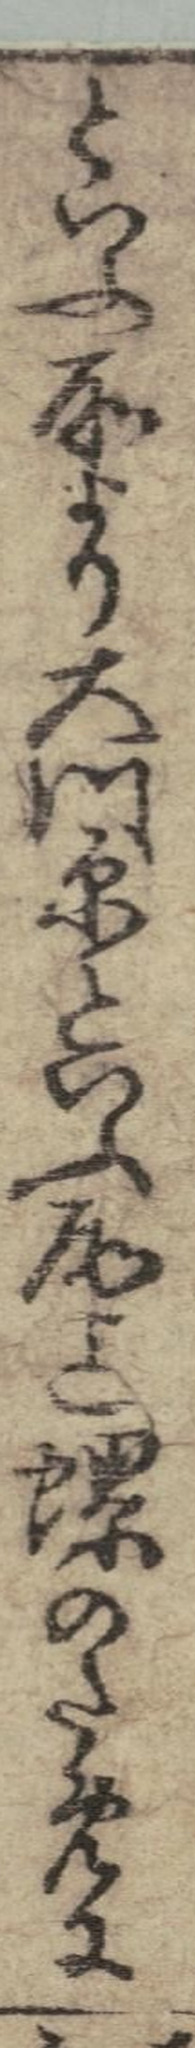といふ所ゟ大川原といふ所迄螺のために
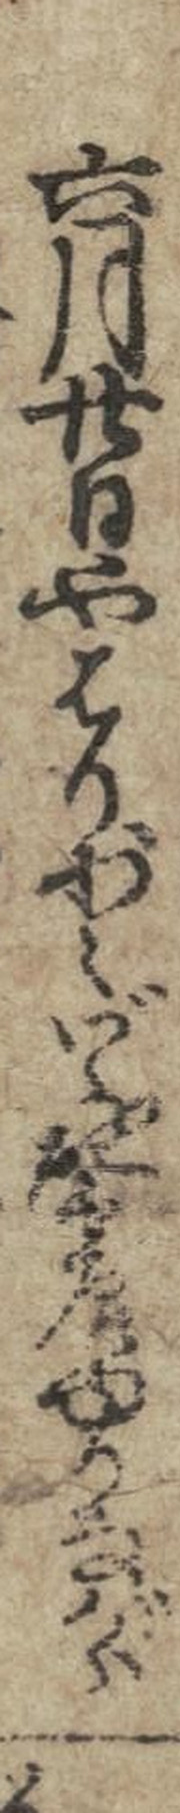六月廿日やはり少〻ヅゝゆりながら
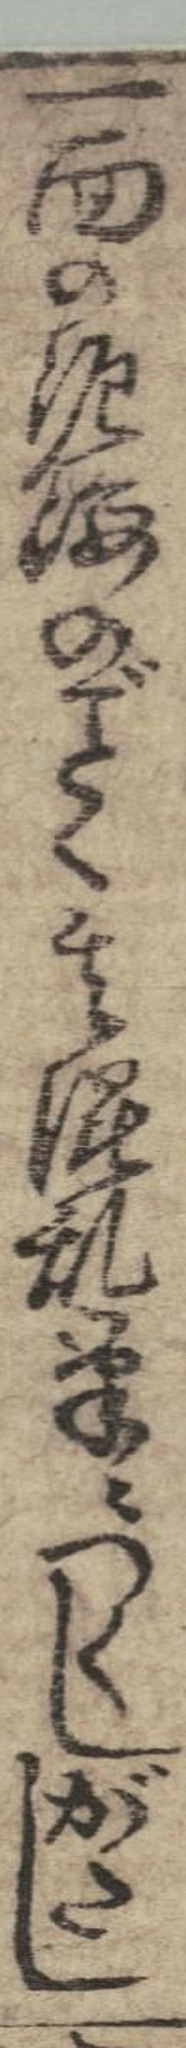一面の泥海のごとく其混乱筆につくしがたし
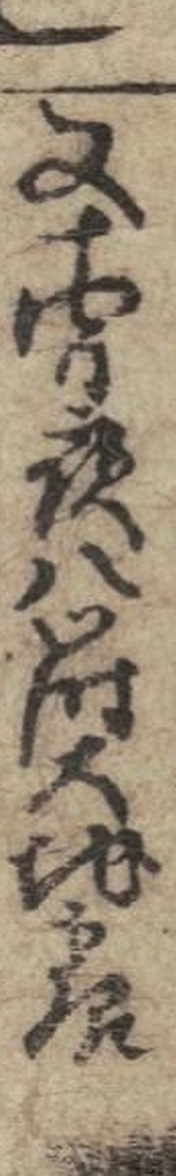又十四日夜八ツ時ゟ大地震
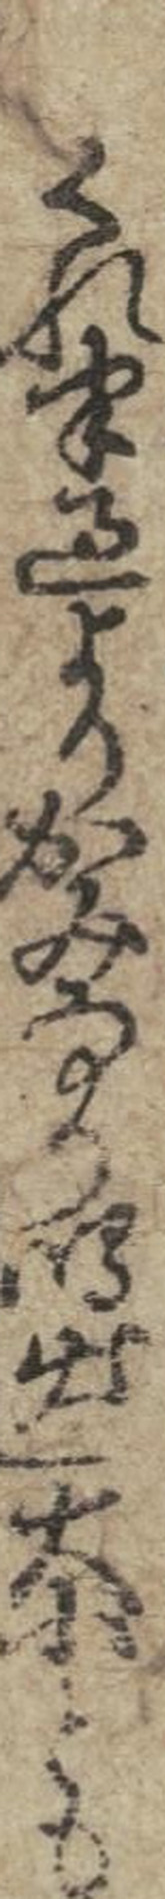くれなり半迄よりかみなり鳴出し大小とも
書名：聞書　諸國大地震并ニ出火・早飛脚廻りにてくわしき所本しらべ　大地震・山城勢州大和三河江州越前　聞書　大地震並ニ出火の次第
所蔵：東京大学地震研究所図書室 Earthquake Research Institute Library, The University of Tokyo, JAPAN
